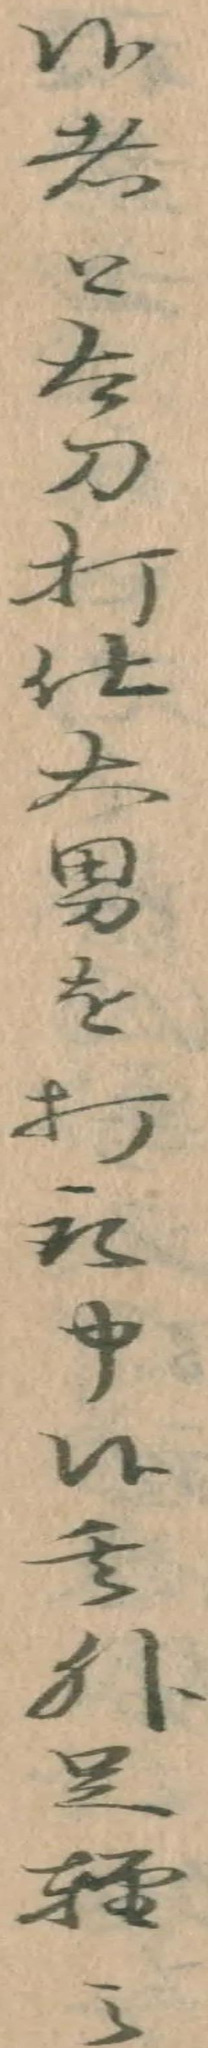候者と太刀打仕大男を打取申候其外足軽之
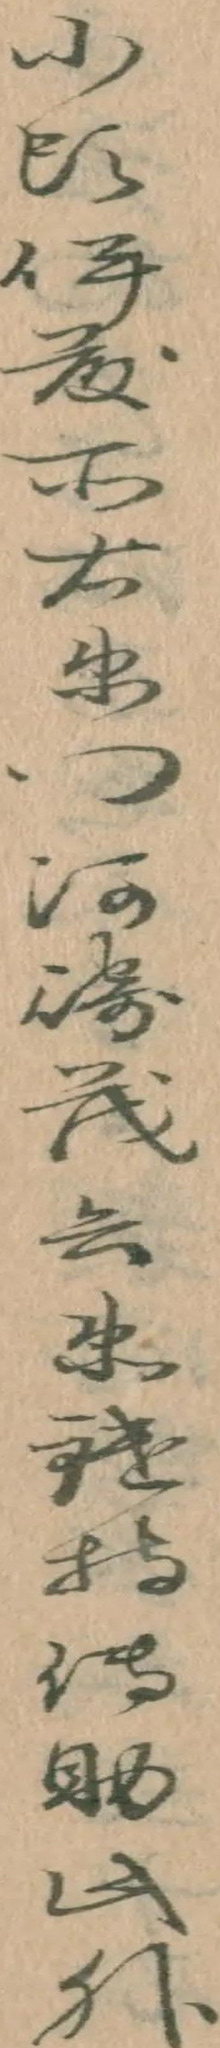小頭伊藤所右衛門河崎茂兵衛鑓持伝助此外
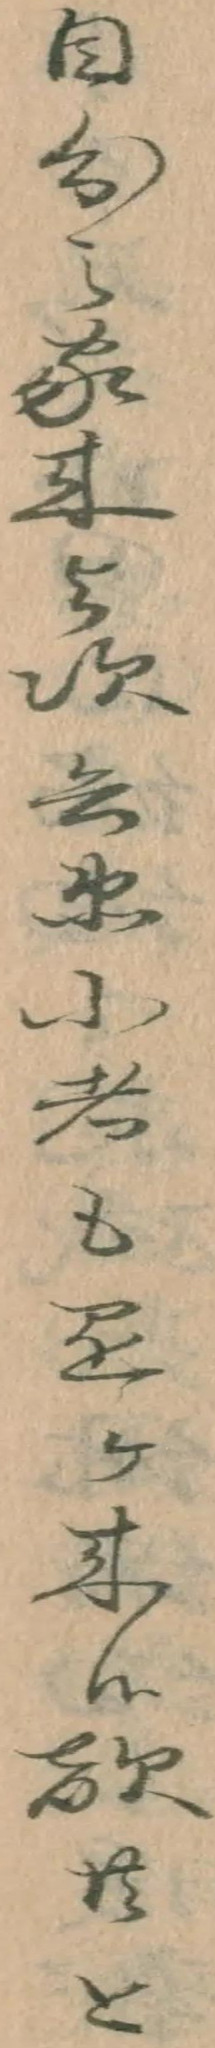自分之家来与次兵衛小者も懸け来候敵共と
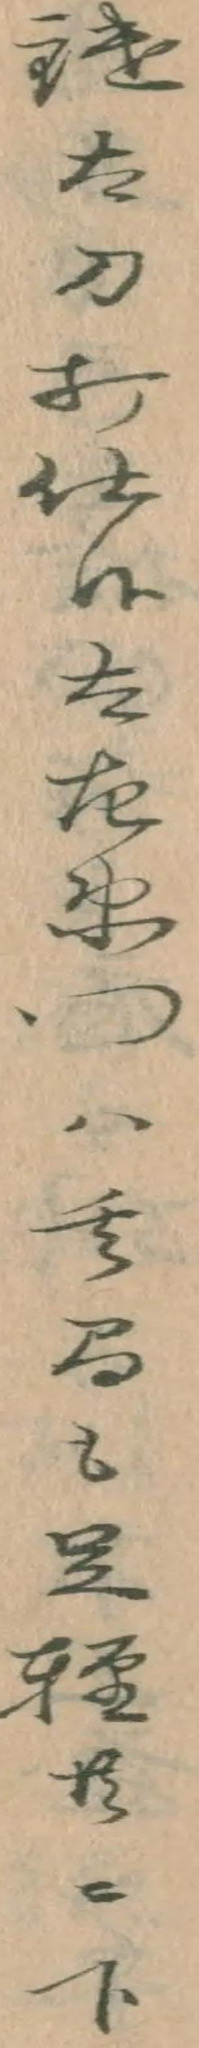鑓太刀打仕候太左衛門は其間も足軽共に下
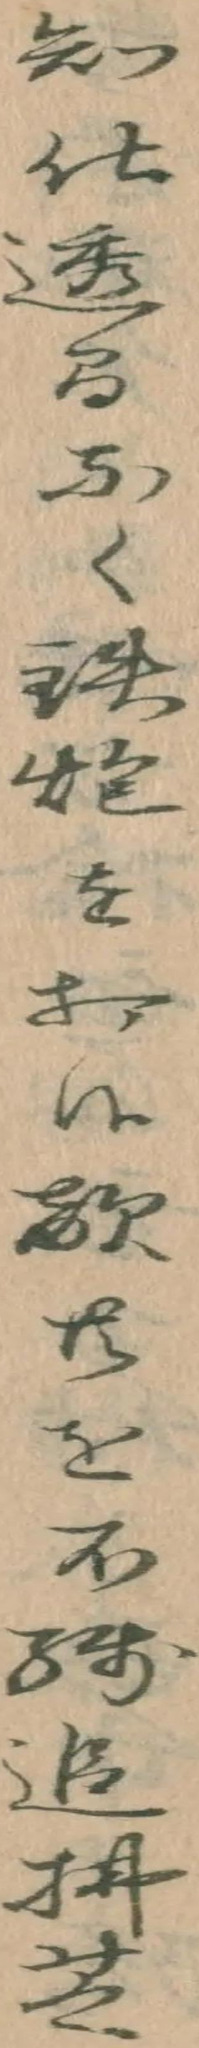知仕透間なく鉄炮を打候敵共を不残追払芝
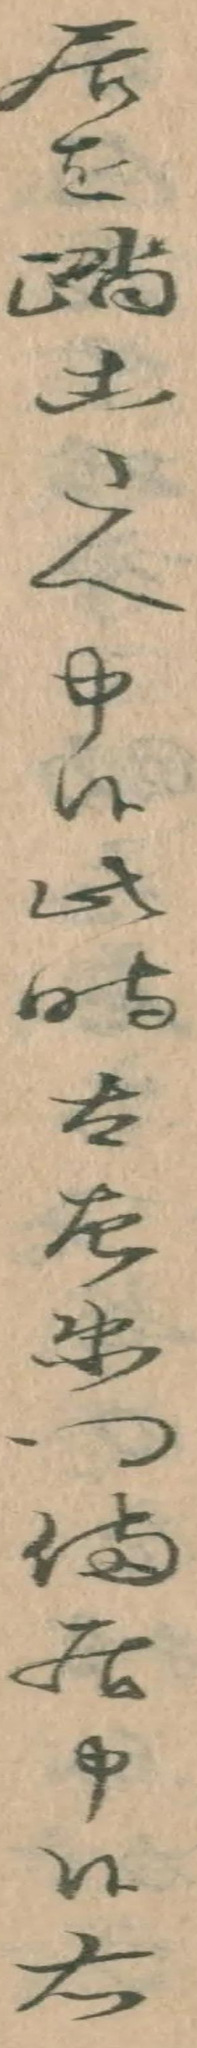居を踏古たへ申候此時太左衛門備居申候右
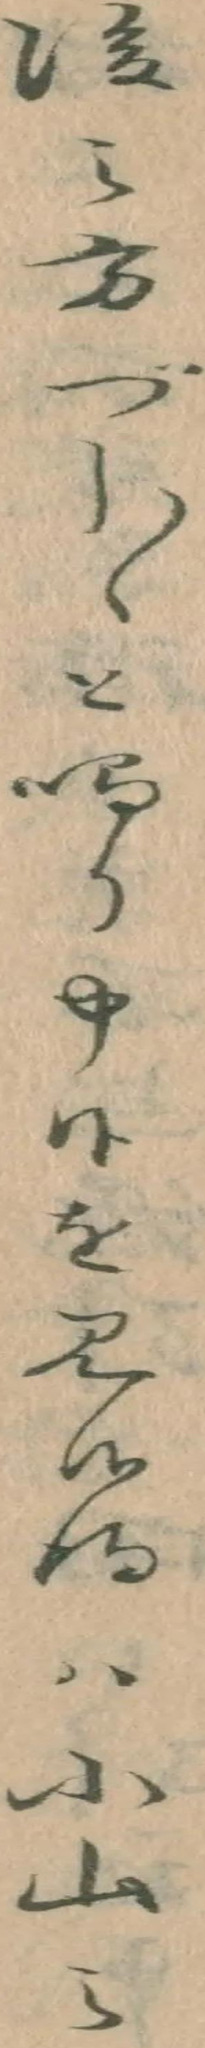後之方づし〱と鳴り申候を見候得は小山之
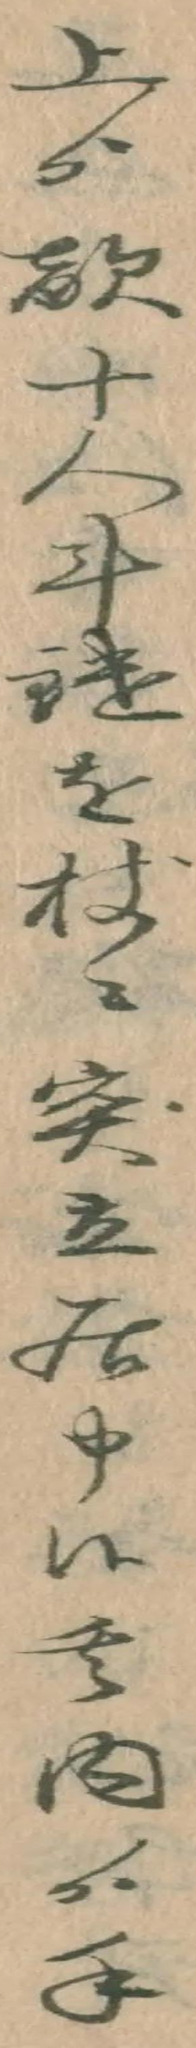上ゟ敵十人斗鑓を杖に突立居申候其内ゟ手
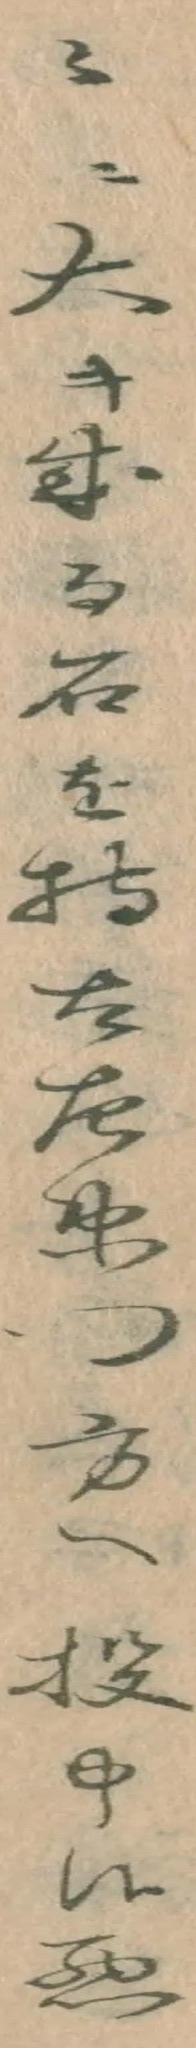〱に大き成る石を持太左衛門方へ投申候悪
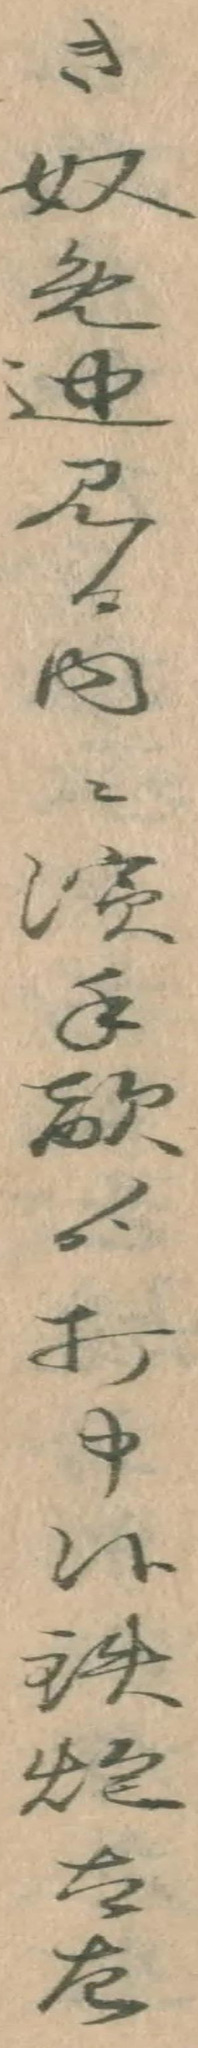き奴免迚見る内に浜手敵ゟ打申候鉄炮太左
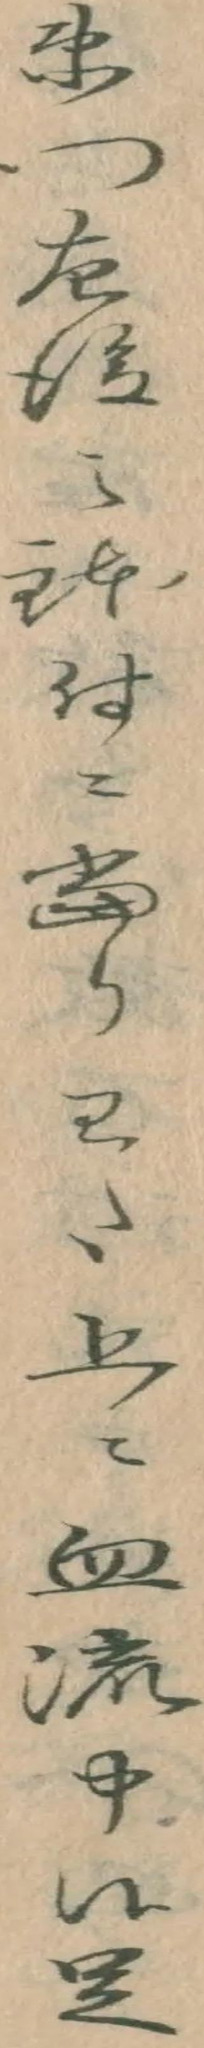衛門左後之鉢付に当り己た上に血流申候足
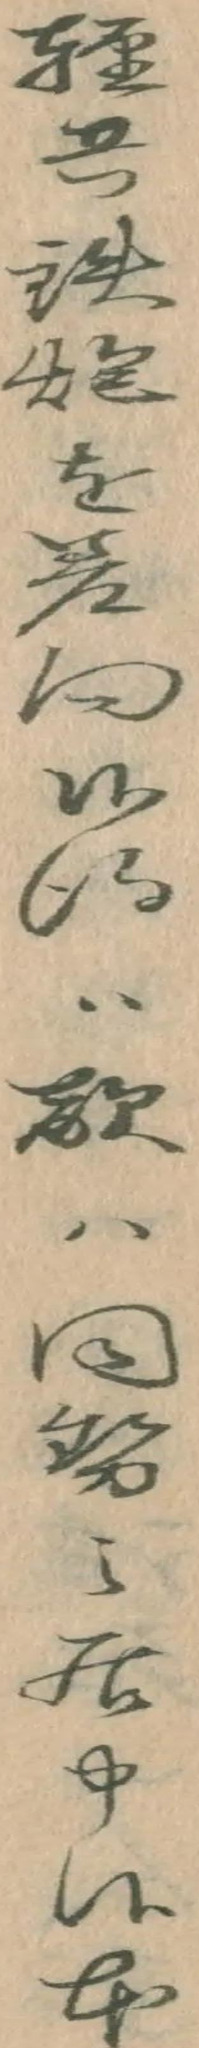軽共鉄炮を差向候得は敵は同勢之居申候本
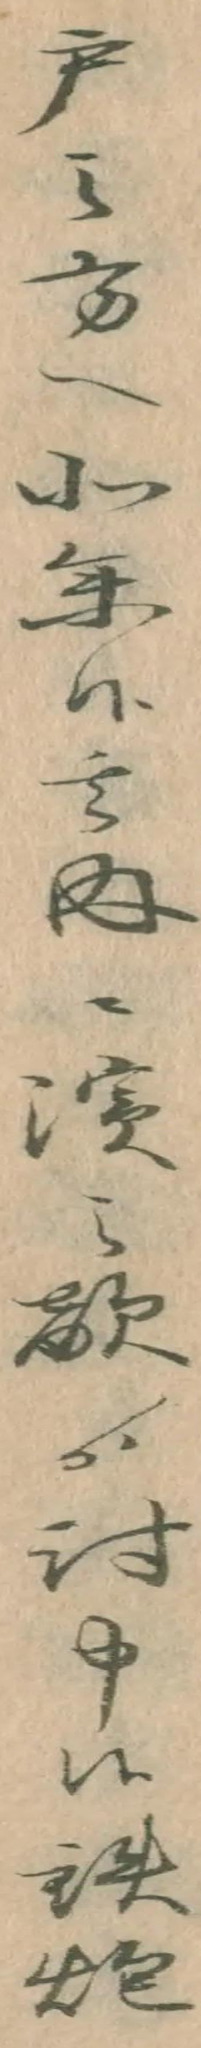戸之方へ北参候其内に浜之敵ゟ討申候鉄炮

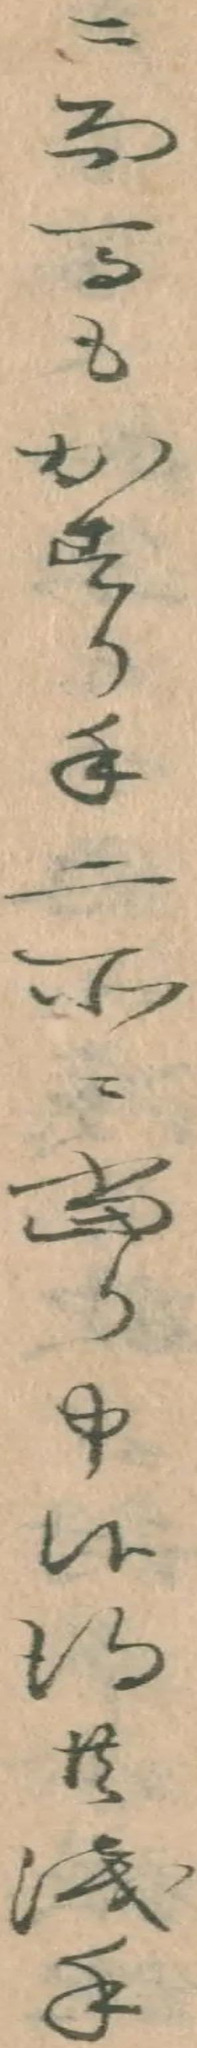に而馬もか春り手二所に当り申候得共浅手
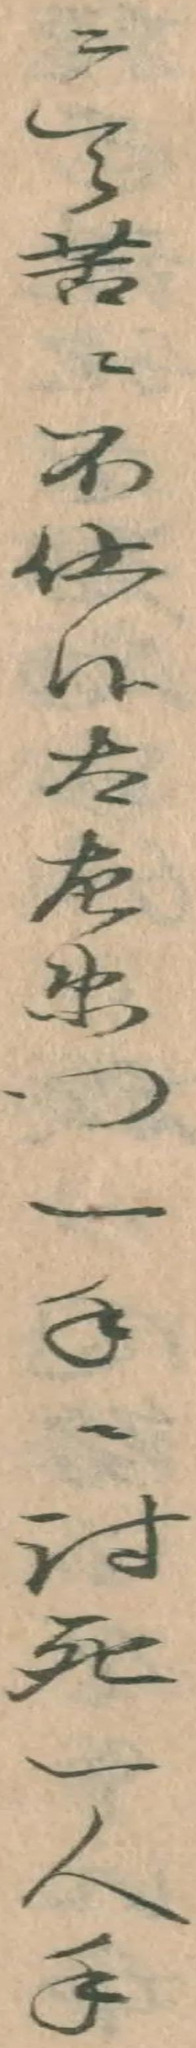にて苦に不仕候太左衛門一手に討死一人手
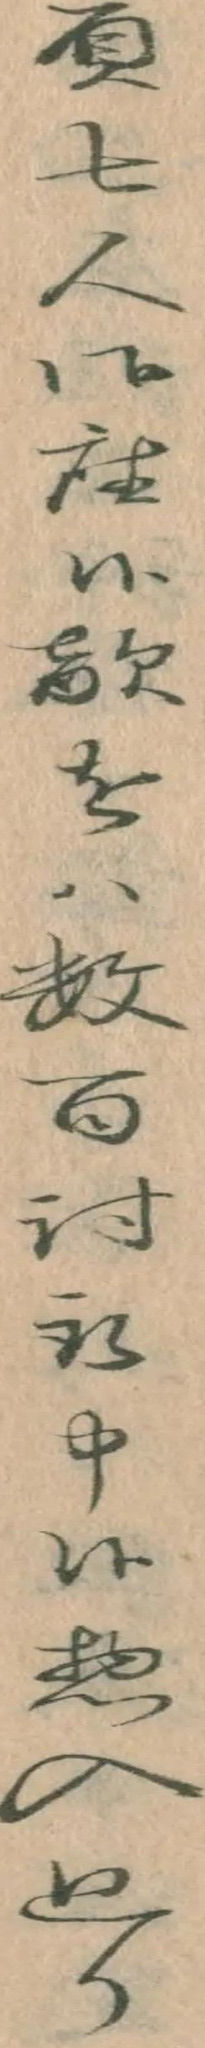負七人御座候敵をは数百討取申候惣入廻り
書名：切支丹御退治記 49巻. [2]
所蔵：国立国会図書館 National Diet Library, JAPAN
